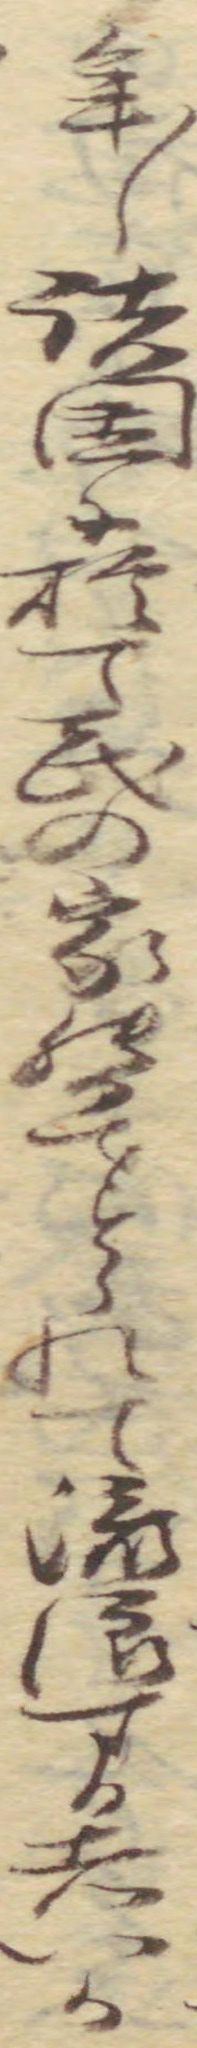年〳〵諸国に於て民の家督をとられて流浪する者いか
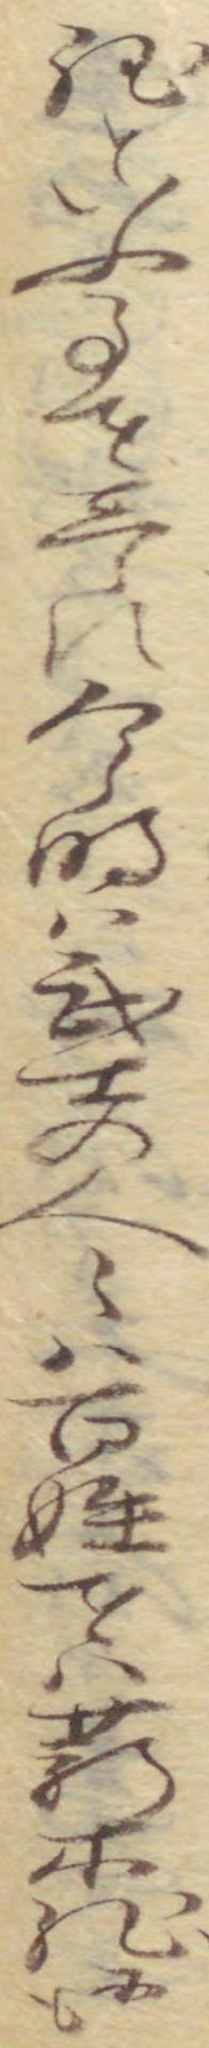程といふ事をしらす今時は武士の人〻は百姓をは薪木程にも
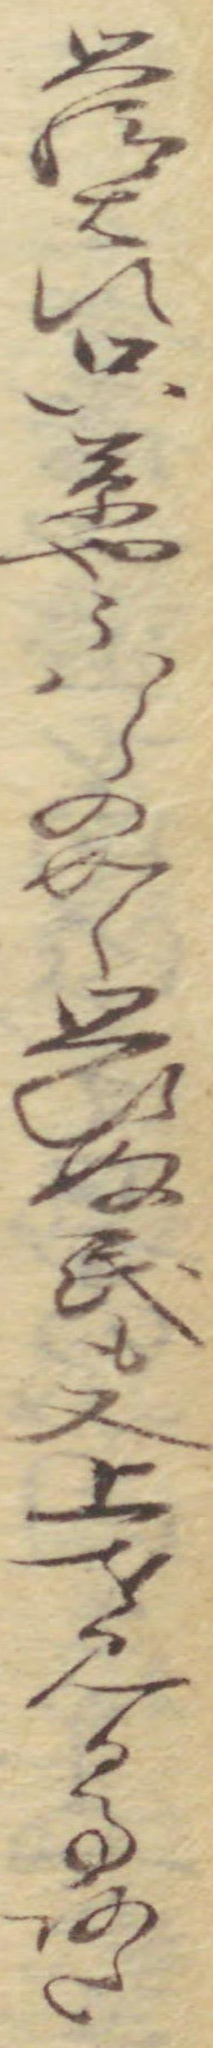思給はす只草やうはらの如く思ひぬ民も又上を見る事あた
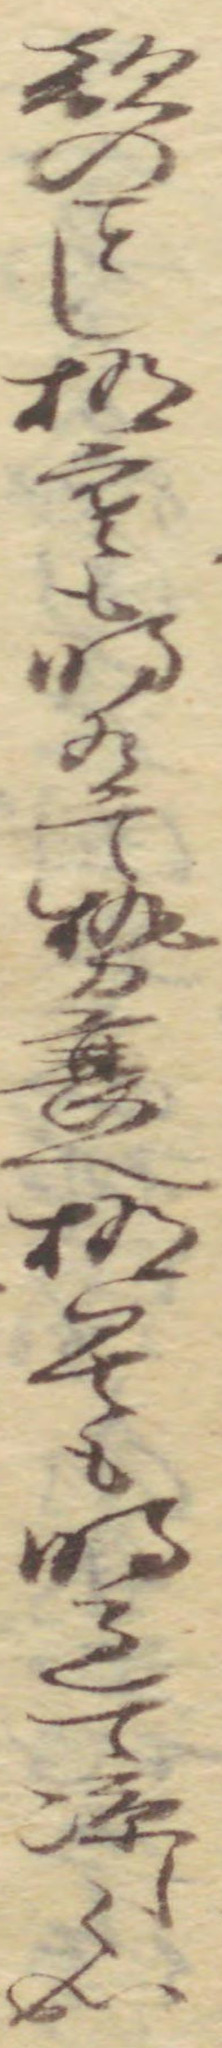敵のことし極寒も時有て勢衰へ極暑も時過て涼しく成
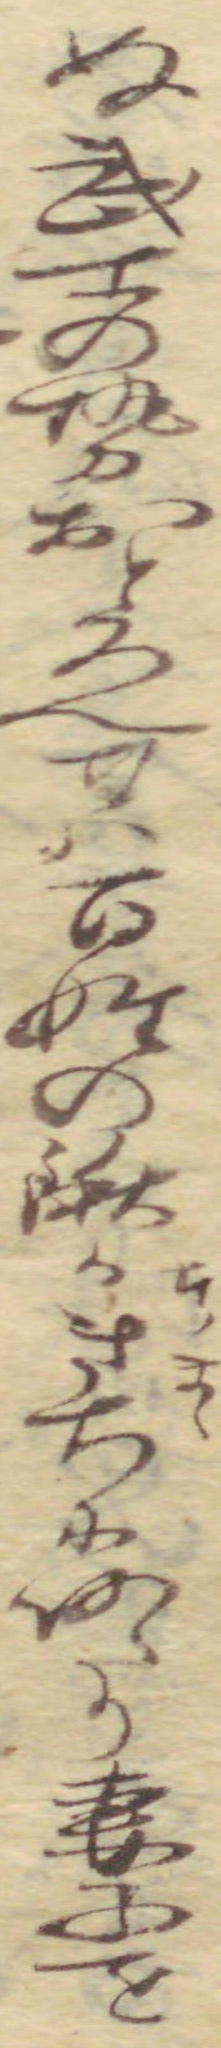ぬ武士の勢おとろへなは百姓の鍬かきろにあたり妻子を
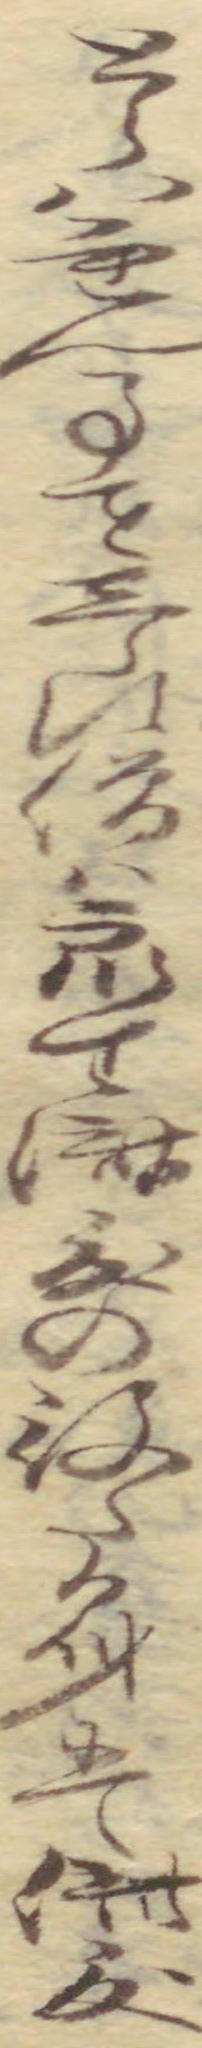とらはれん事をしらす僧は衆生済度の役たる身にて済度
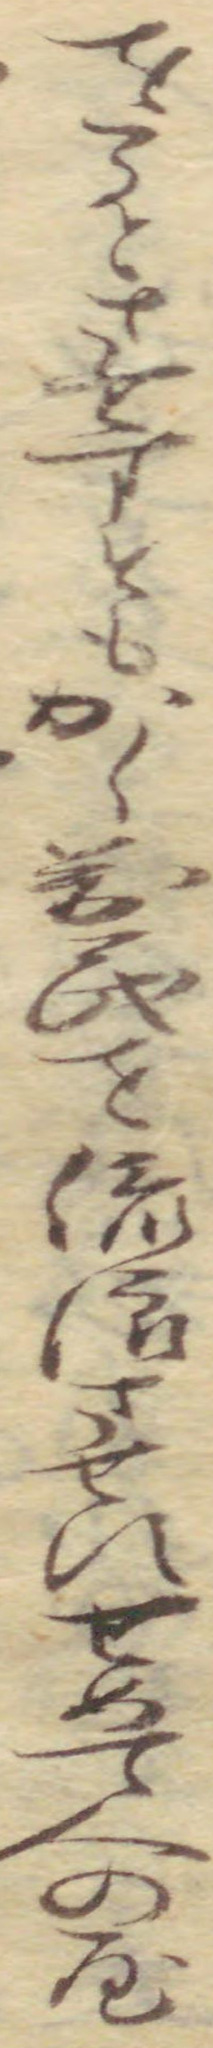をこそさせすともかく万民を流浪させすせめて人の屋
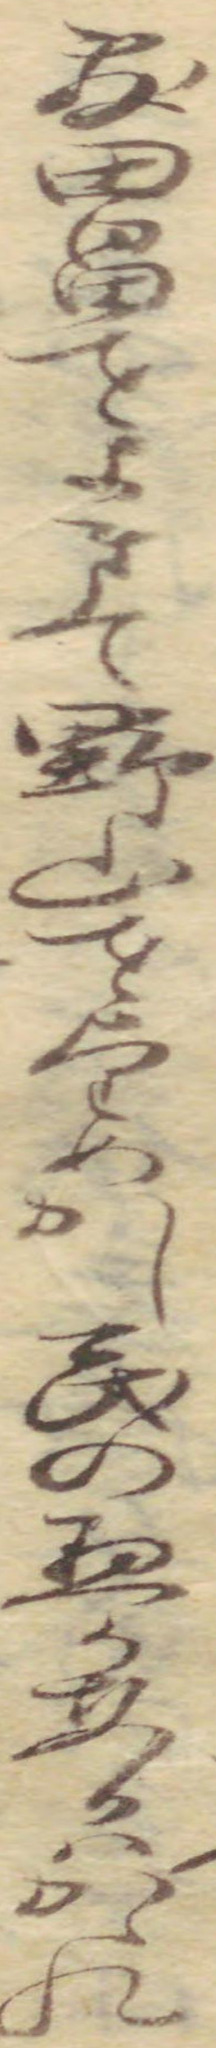敷田畠をよきて野山を望めかし民の懸りなるはかゝれ
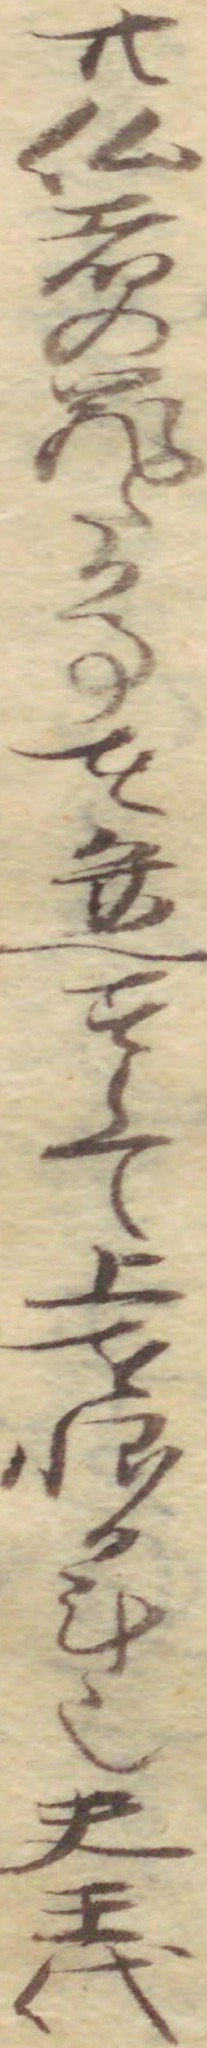共仏者の罪たる事を弁へすして上を恨る計也夫王代
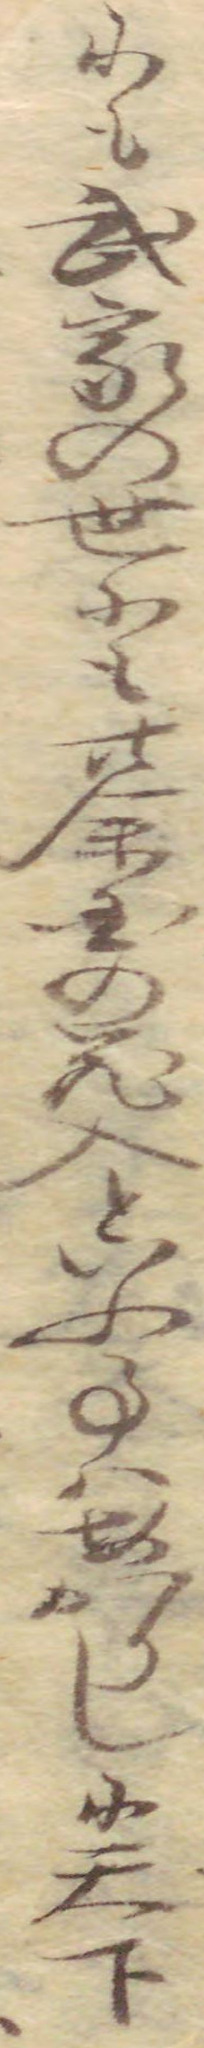にも武家の世にも廿余国の蔵入といふ事はなかりしに天下
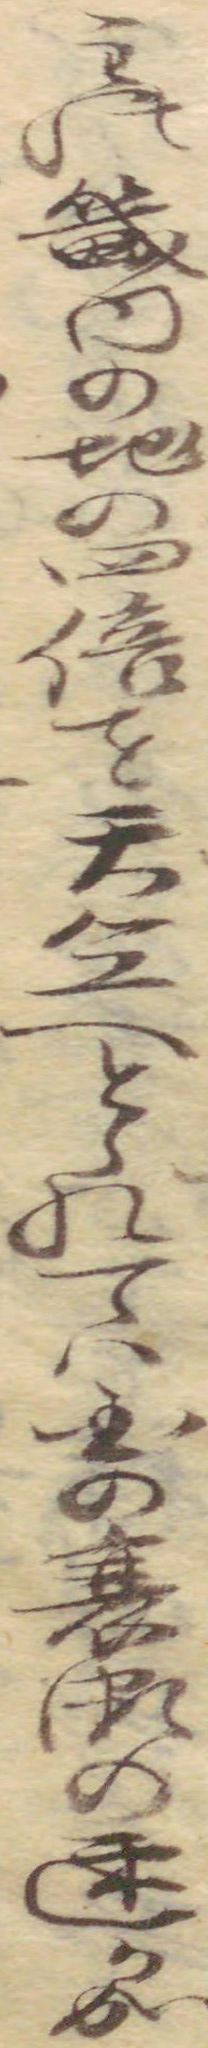主の畿内の地の四倍を天竺へとられては国の衰微の速か成
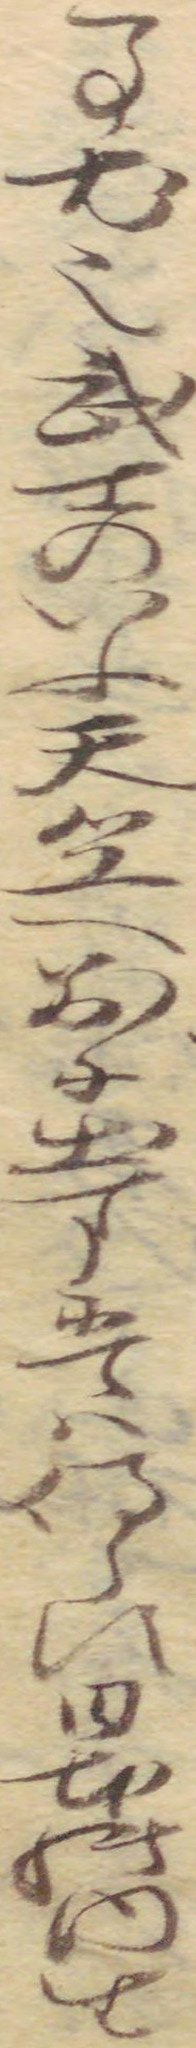事尤也武士のいふ天竺へ別に出すにては侍らす日本の内生
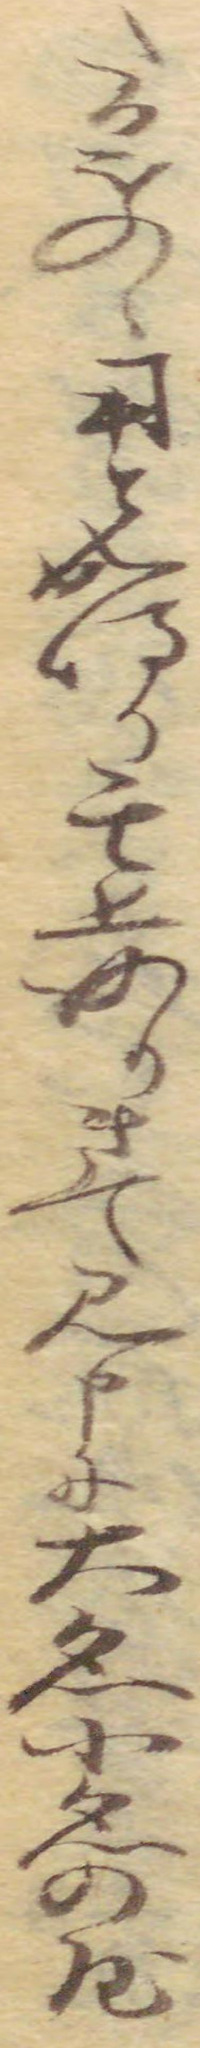たるものゝ用と成侍り其上ありきて見申に大名小名の屋

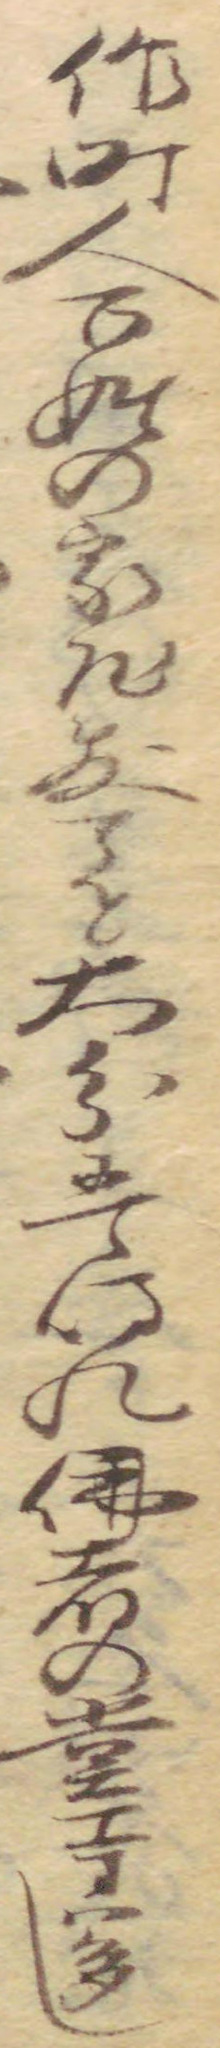作町人百姓の家屋敷こそ大分にて侍れ仏者の堂寺は多し
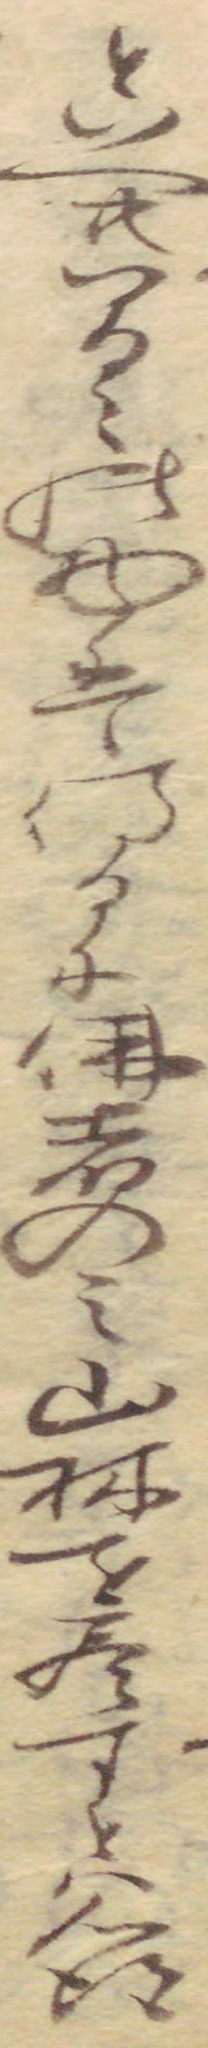といへ共間〻の物にて侍るに仏者のみ山林を尽すとは心得
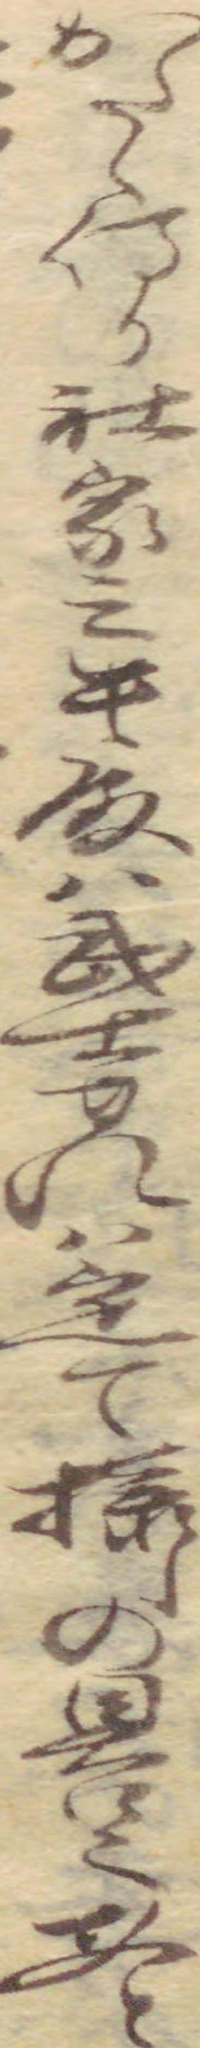かたく侍り社家云貴殿は武士なれは定て様？〻？の具足なと
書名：鶯宿雑記. 巻263-264
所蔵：国立国会図書館 National Diet Library, JAPAN
